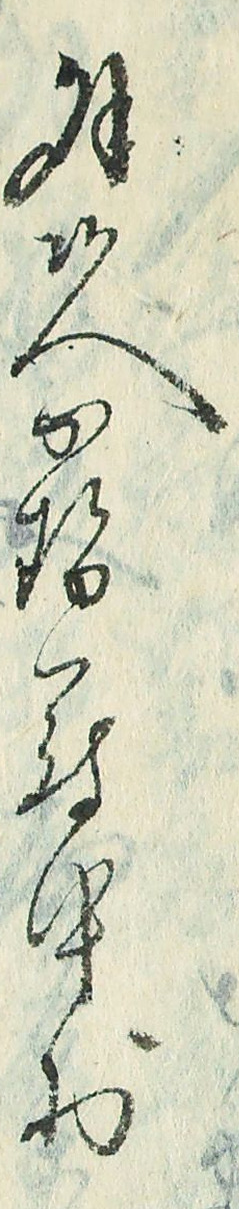外弐人加勢府中村

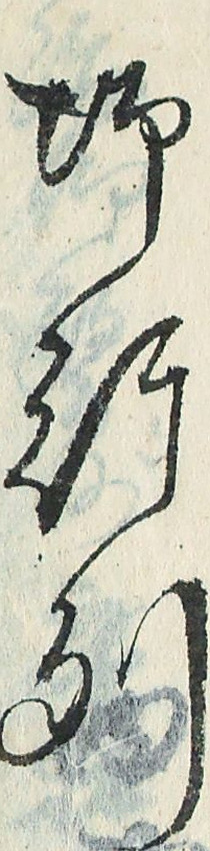御行列
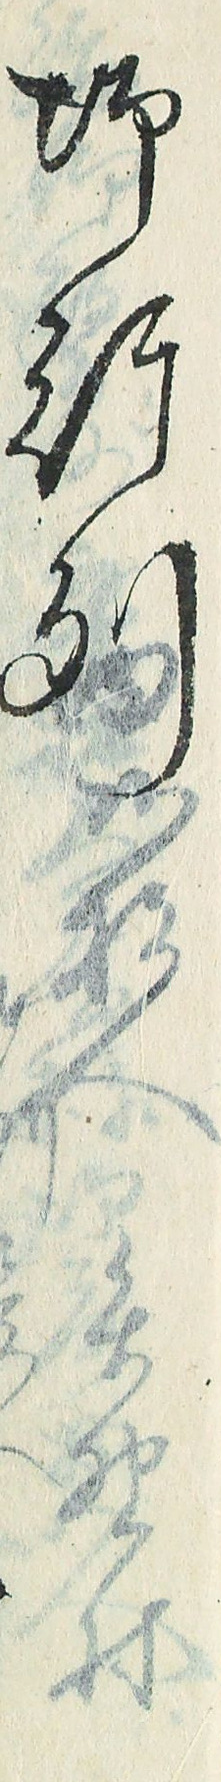御行列
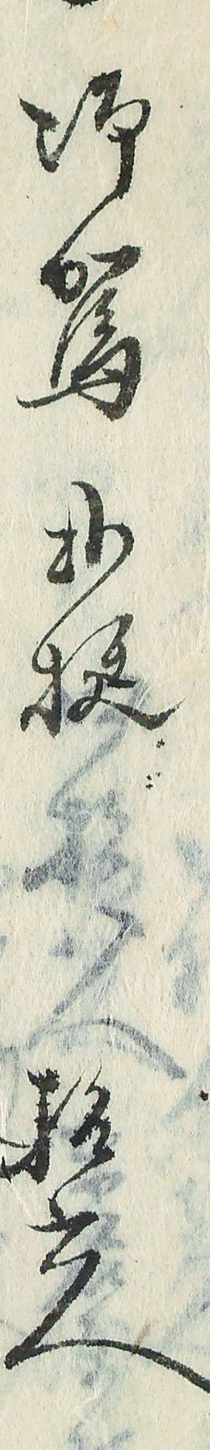一御駕弐挺拾六人
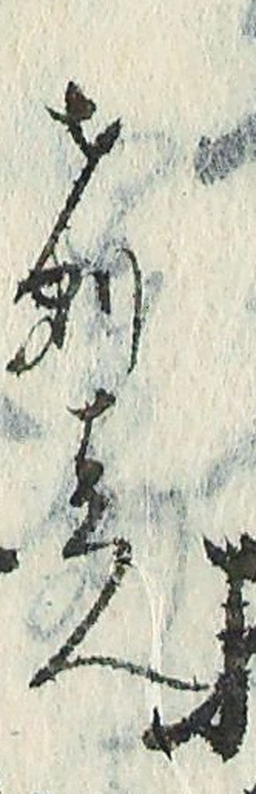才判壱人
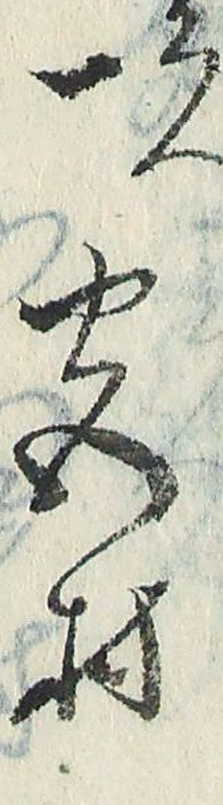一宮村
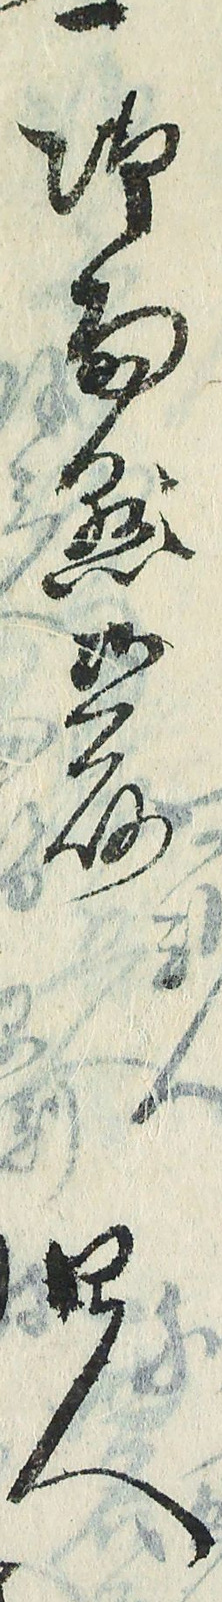一御両懸弐荷四人
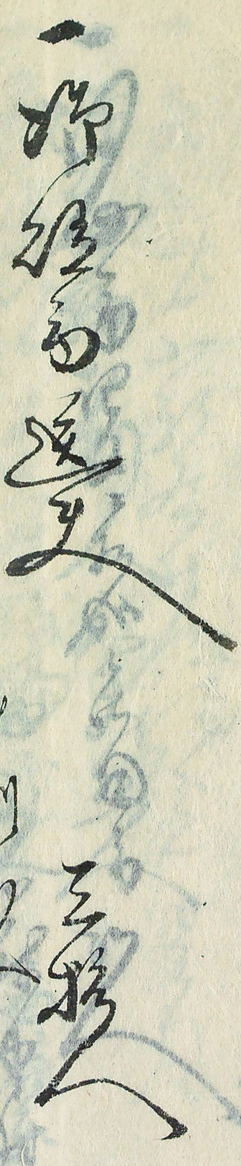一御賄方送夫三拾人
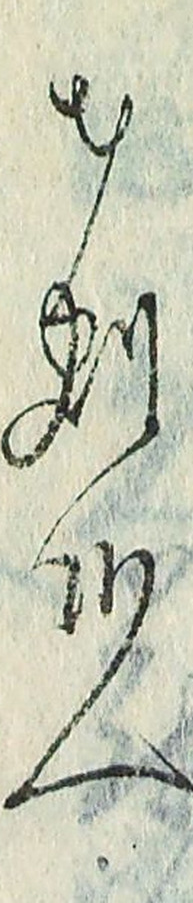才判弐人
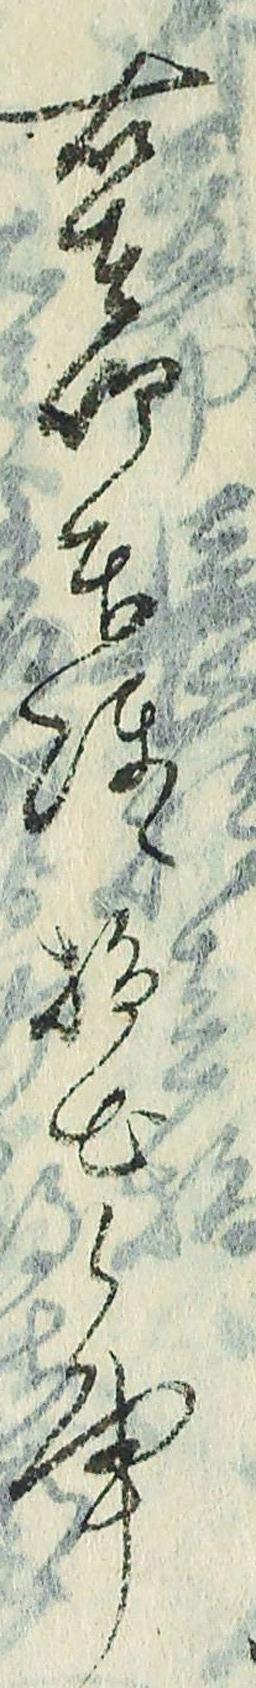右は御本陣へ指出候事
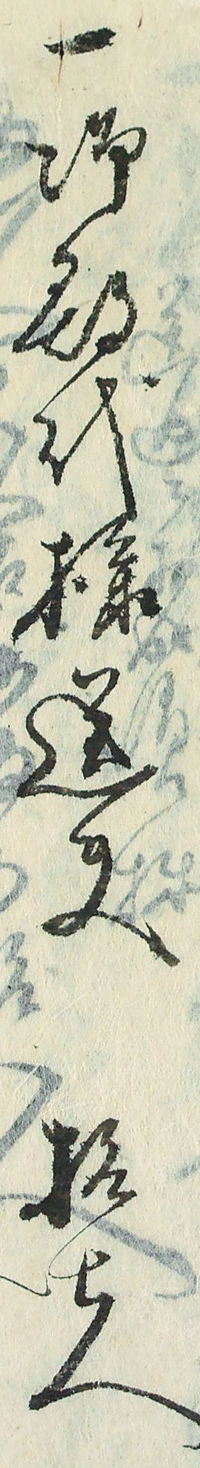一御郡代様送夫拾七人
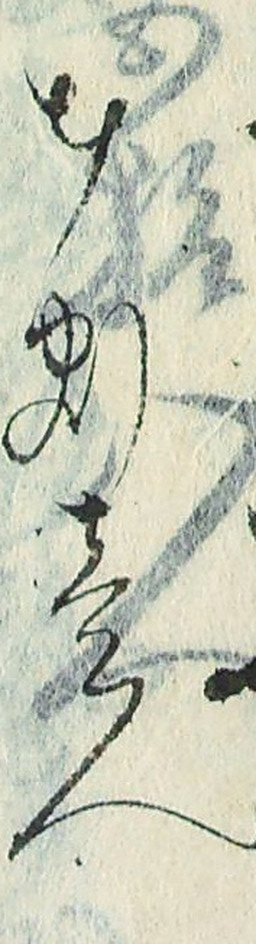才判壱人
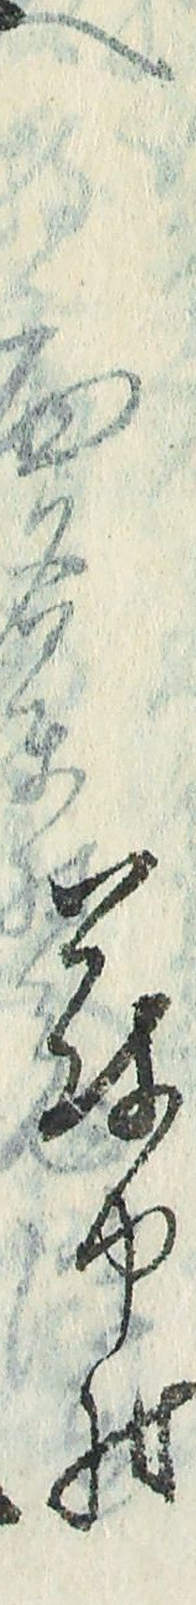府中村
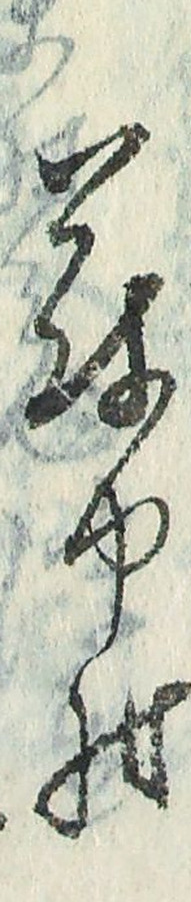府中村
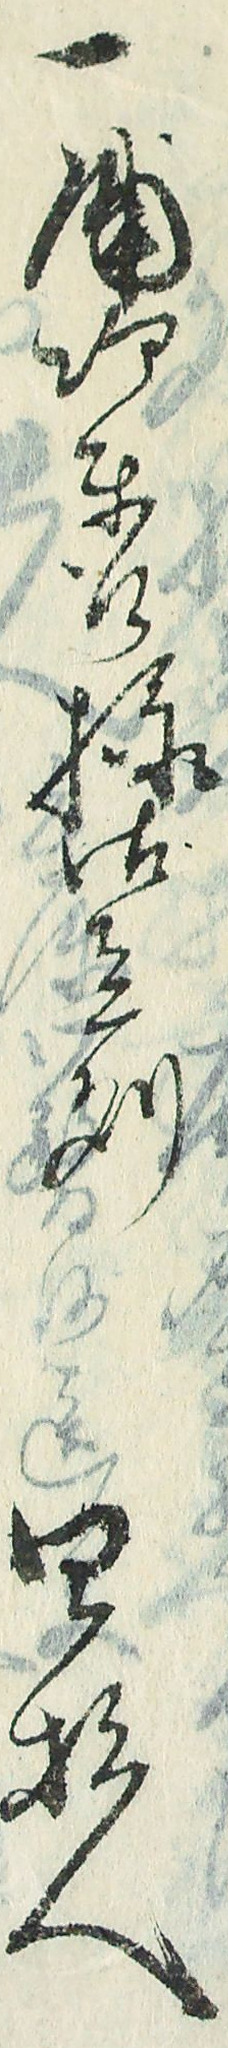一浦御奉行様御壱列四拾人

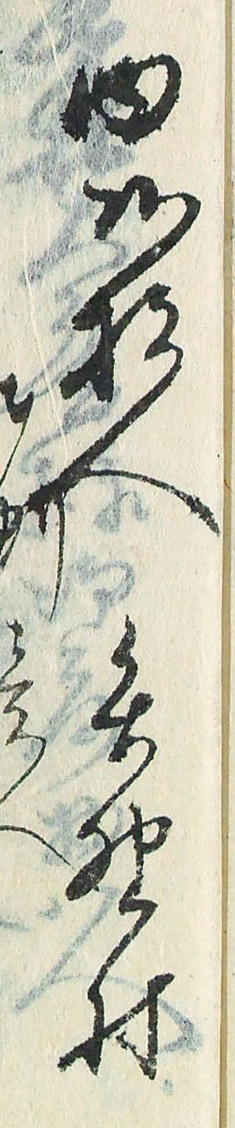内弐拾人矢野村
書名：公辺御役人為御廻浦御立越諸御用一巻
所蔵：鳴門教育大学 Naruto University of Education
